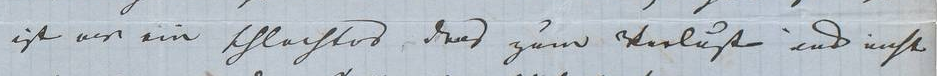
ist es ein schlechtes das zum Verlust und nicht
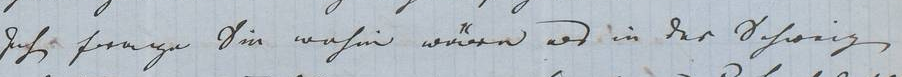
Ich frage Sie wohin wäre es in der Schweiz
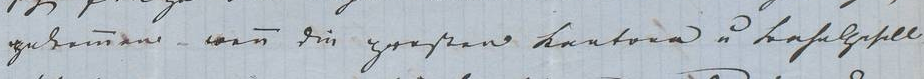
gekommen – wenn die großen Kantone u Bahngesell-
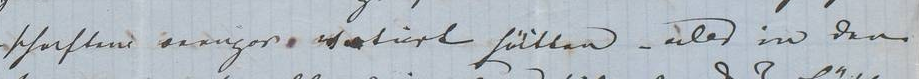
schaften weniger votirt hätten – als in den
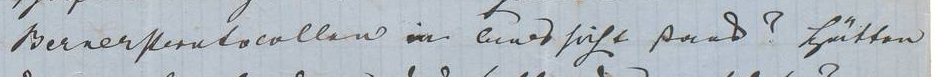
Berner Protocollen in Aussicht stand? Hätten
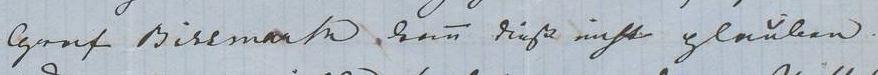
Graf Bissmark kann dieß nicht glauben –
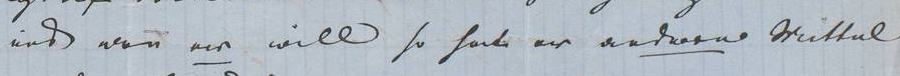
und wenn er will so hat er andere Mittel
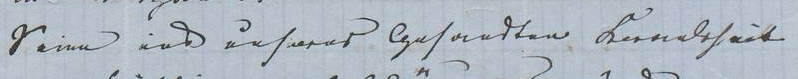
Seine und unserer Gesandten Krankheit
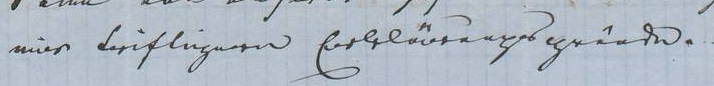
mir triftigere Erklärungsgründe. –
